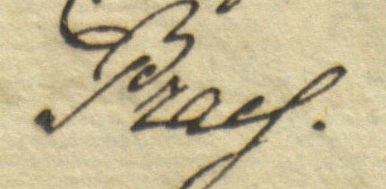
Praes.
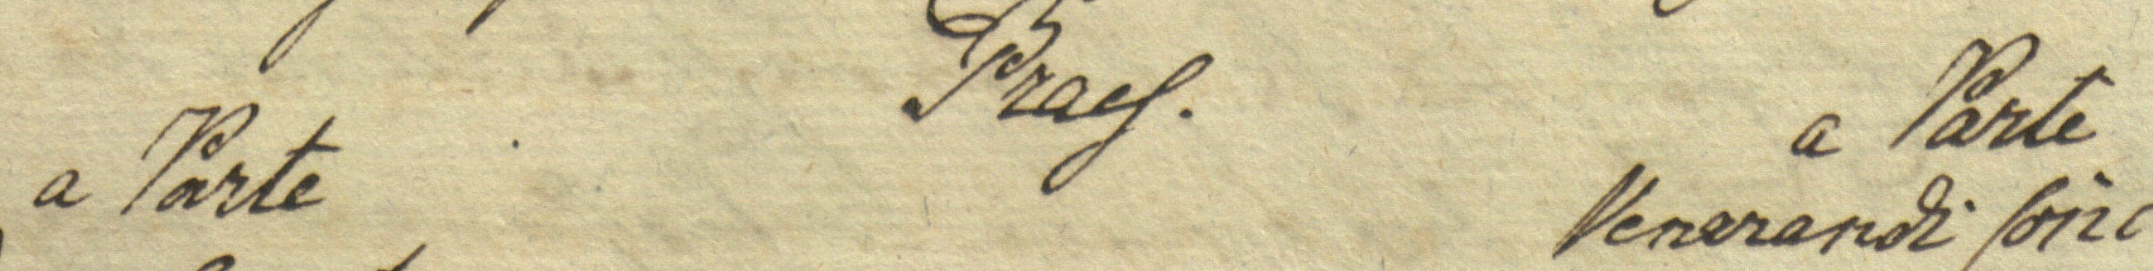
a Parte a Parte
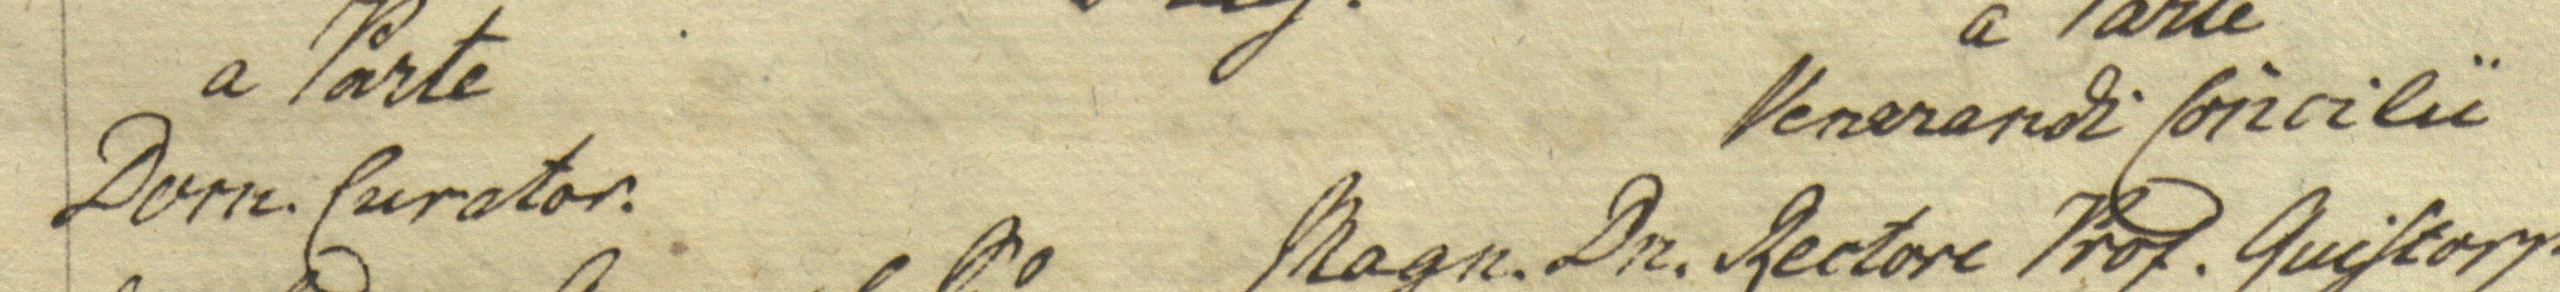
Dom. Curator. Venerandi Concilii
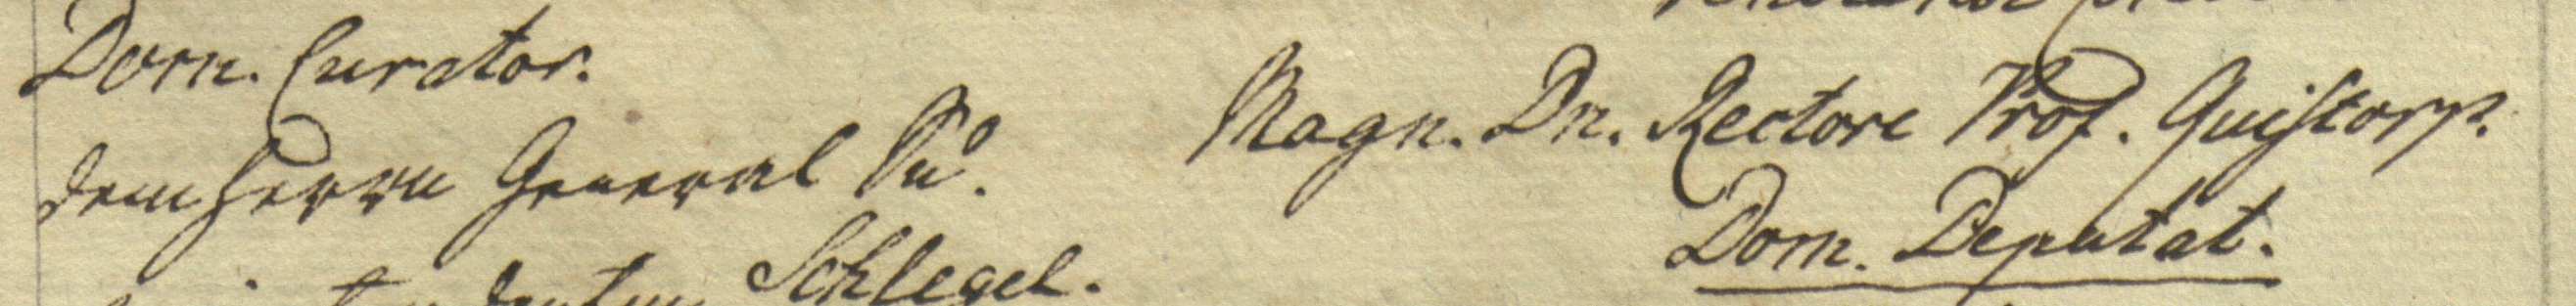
dem Herrn General Su¬ Magn. Dn. Rectore Prof. Quistorp.
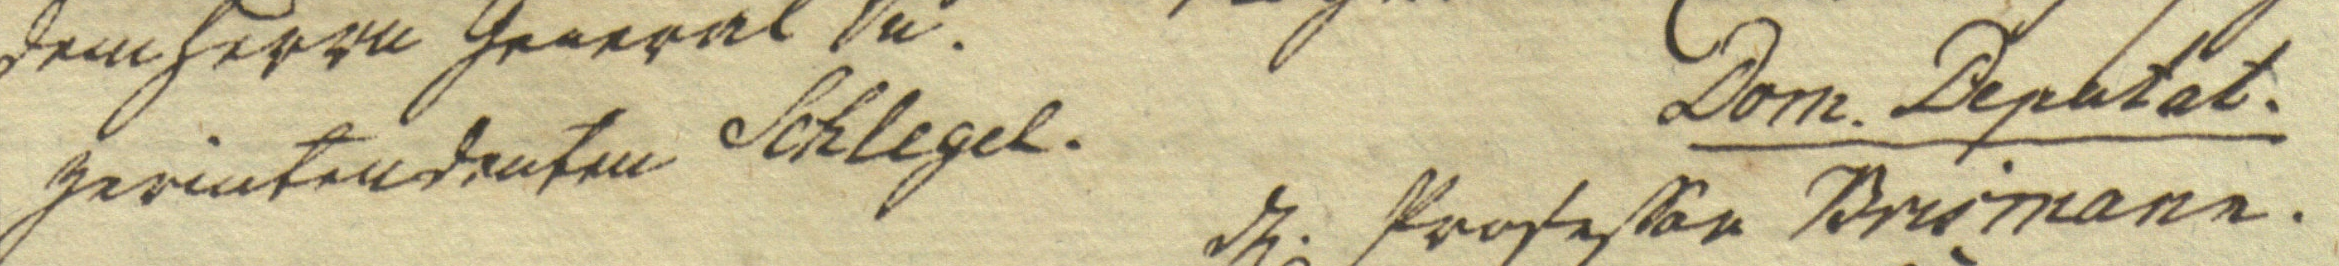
perintendenten Schlegel. Dom. Deputat.
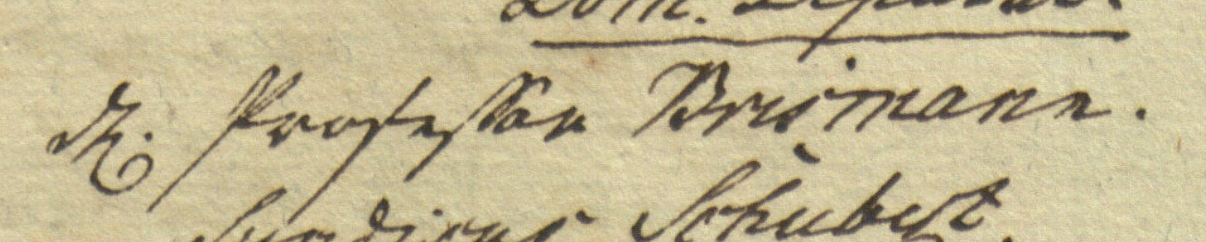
dh. Professor Brismann.
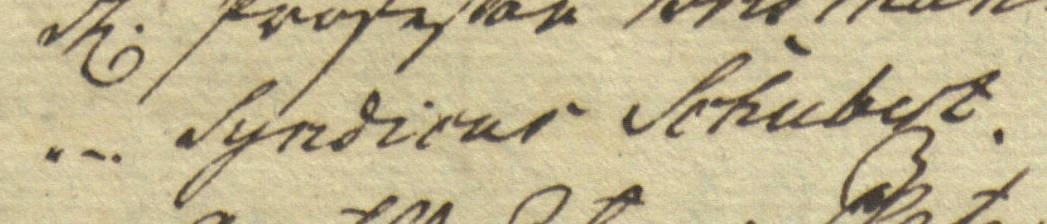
Sÿndicus Schubert.
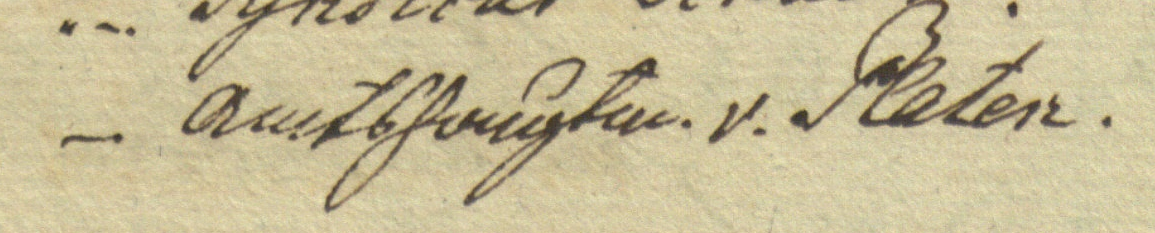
Amtshauptm. v. Platen.
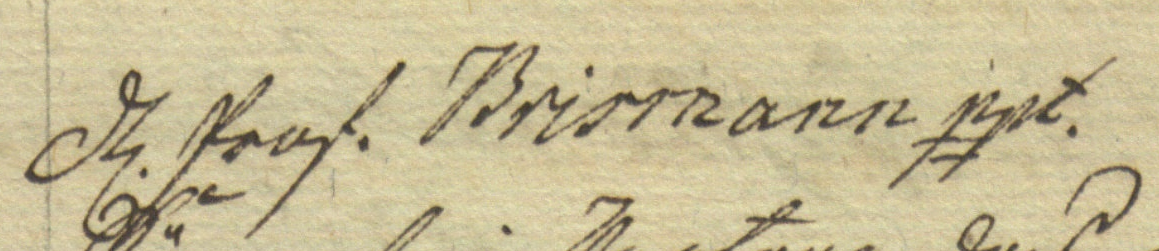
Dh. Prof. Brismann ppt.
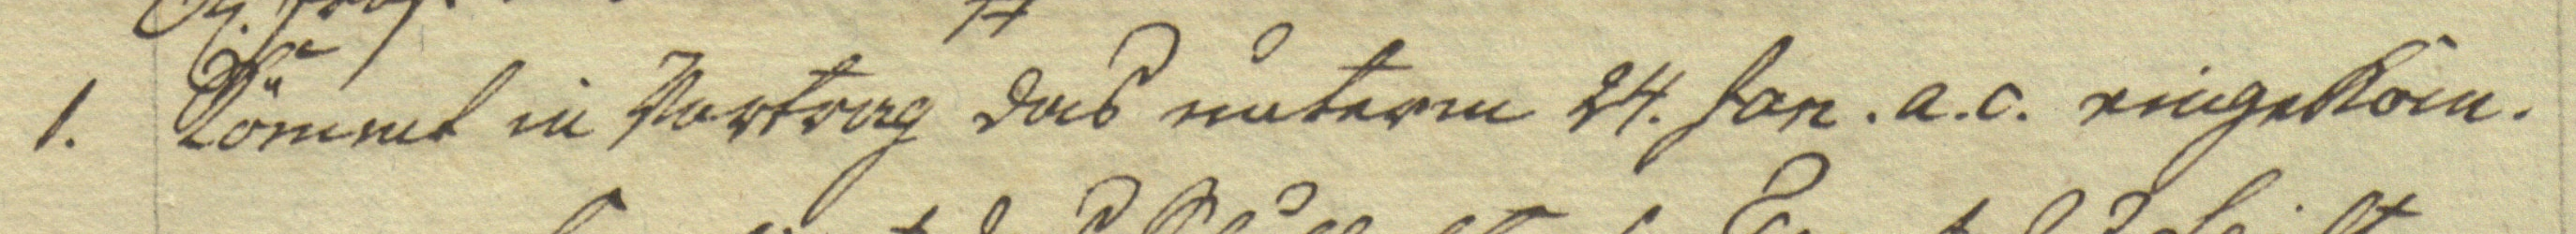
1. Kömmt in Vortrag das unterm 24. Jan. a. c. eingekom¬
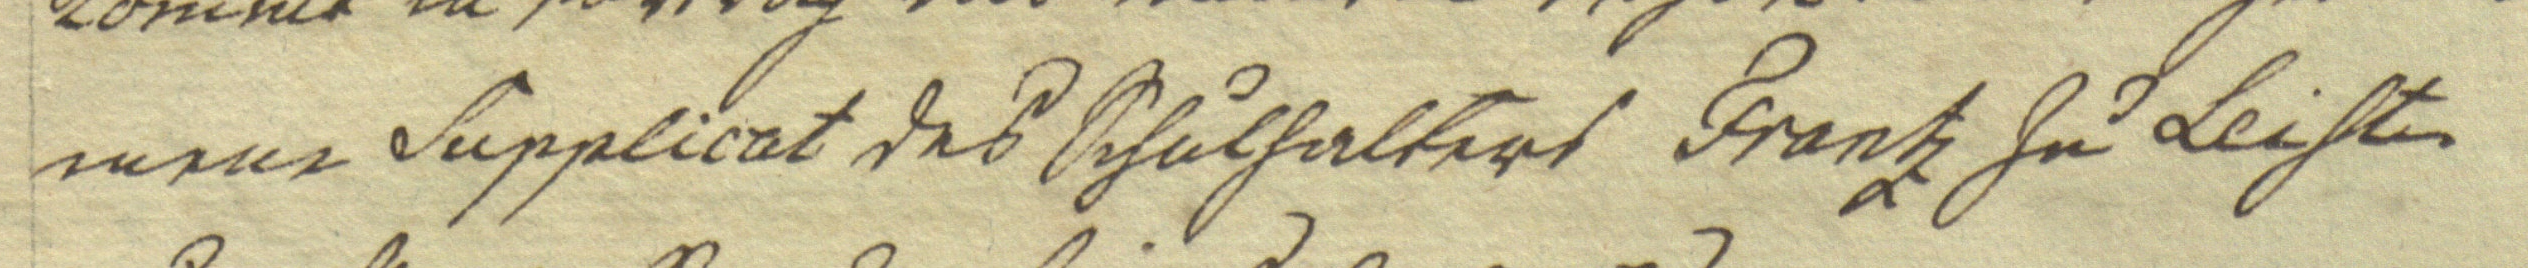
mene Supplicat des Schulhalters Frantz zu Leisten
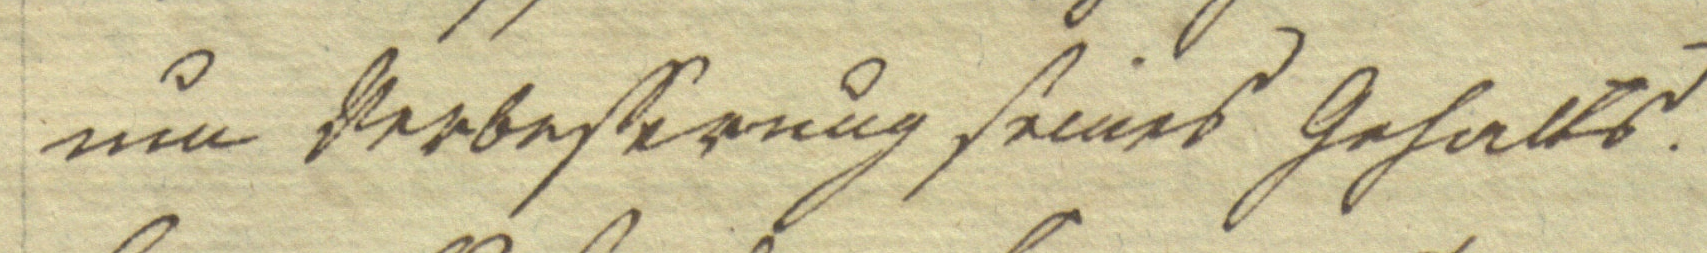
um Verbesserung seines Gehalts.
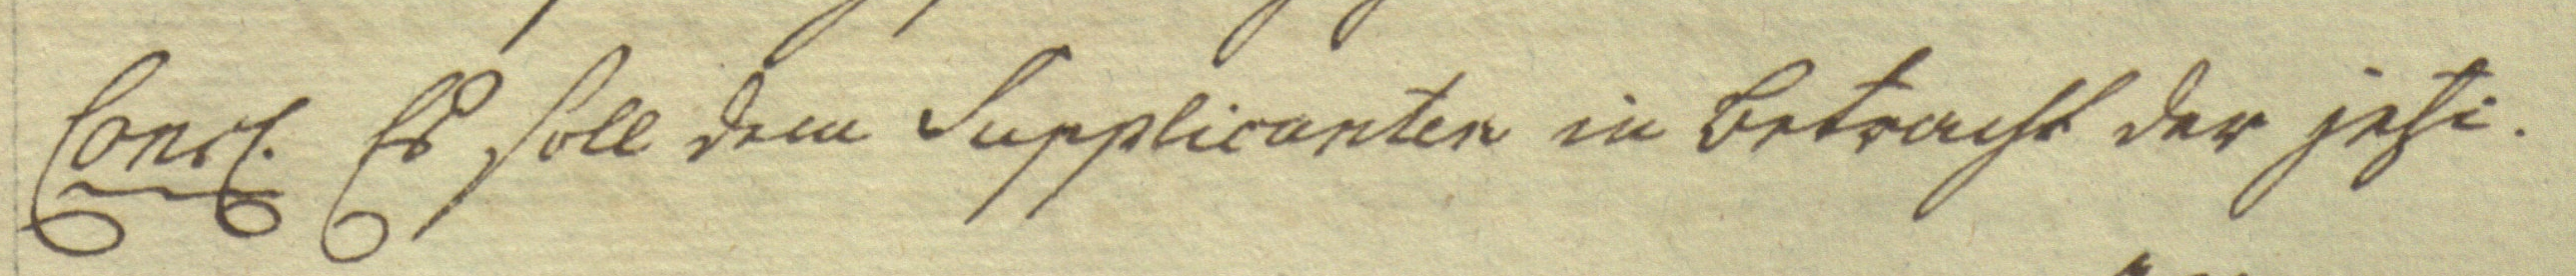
Concl. Es soll dem Supplicanten in Betracht der jetzi¬
